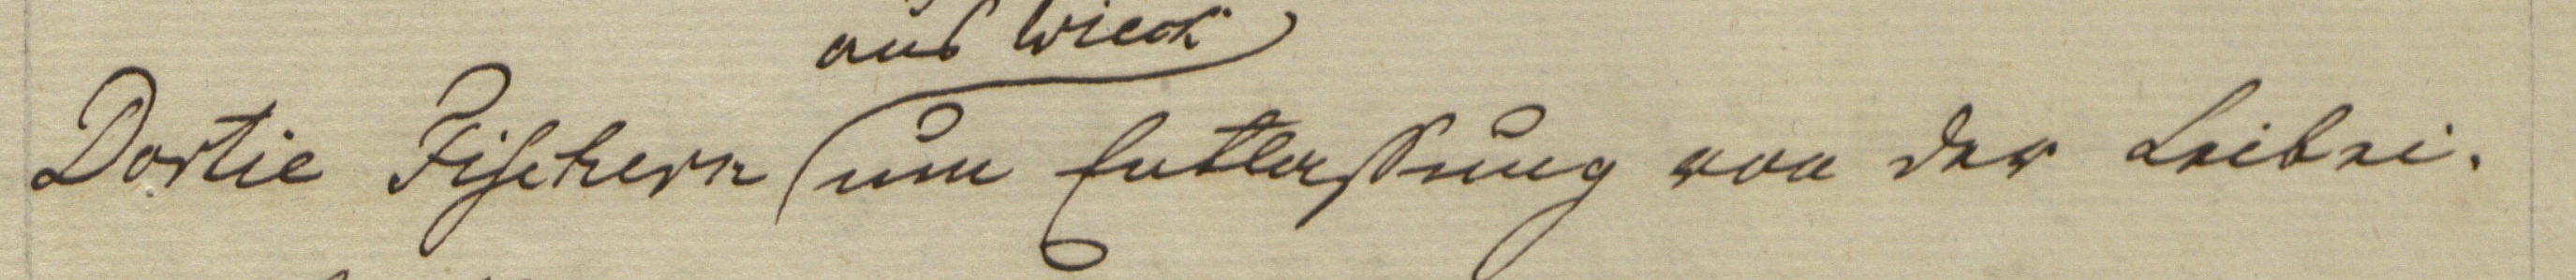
Dortie Fischern aus Wieck um Entlassung von der Leibei¬
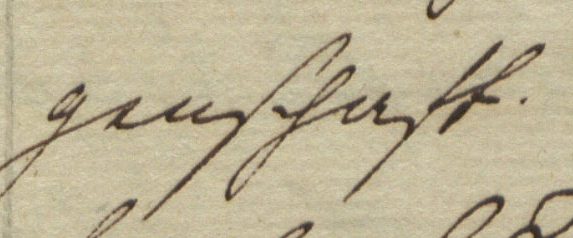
genschaft.
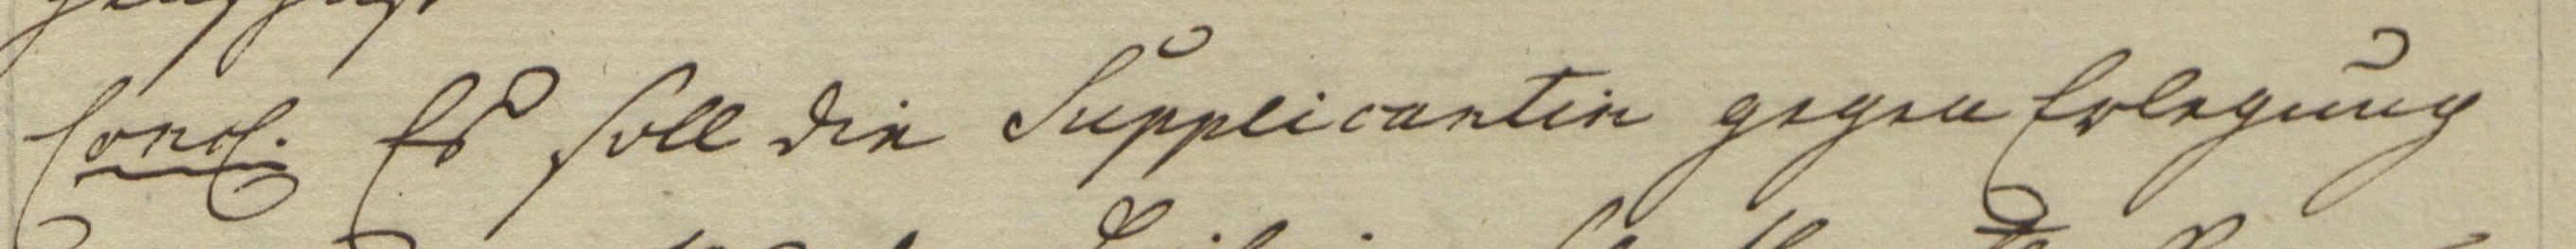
Concl. Es soll die Supplicantin gegen Erlegung
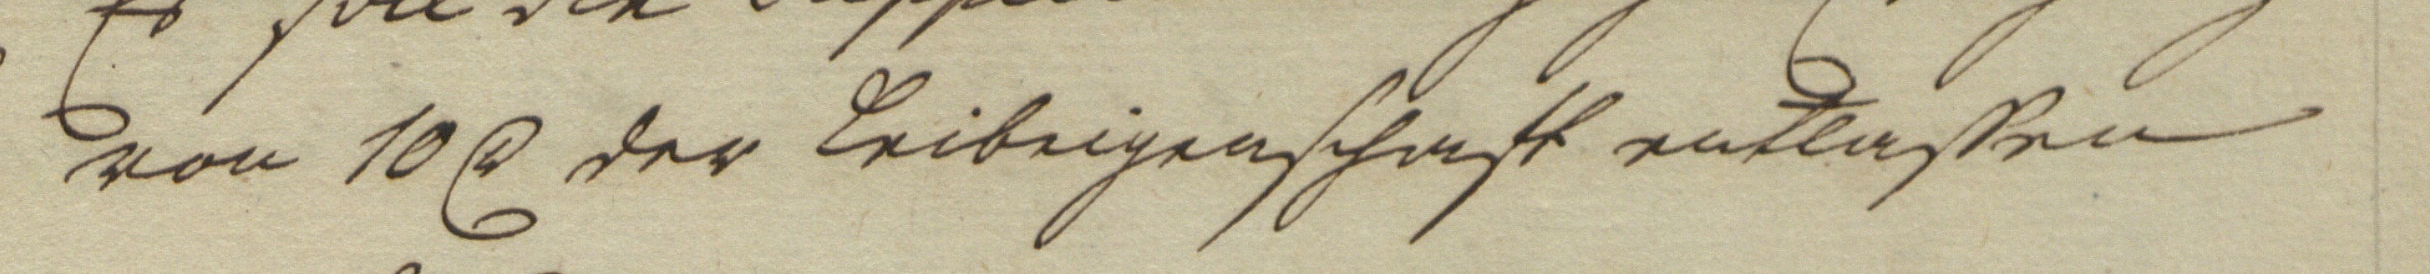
von 10 l der Leibeigenschaft entlassen
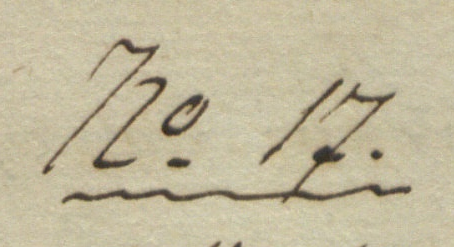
No 17.
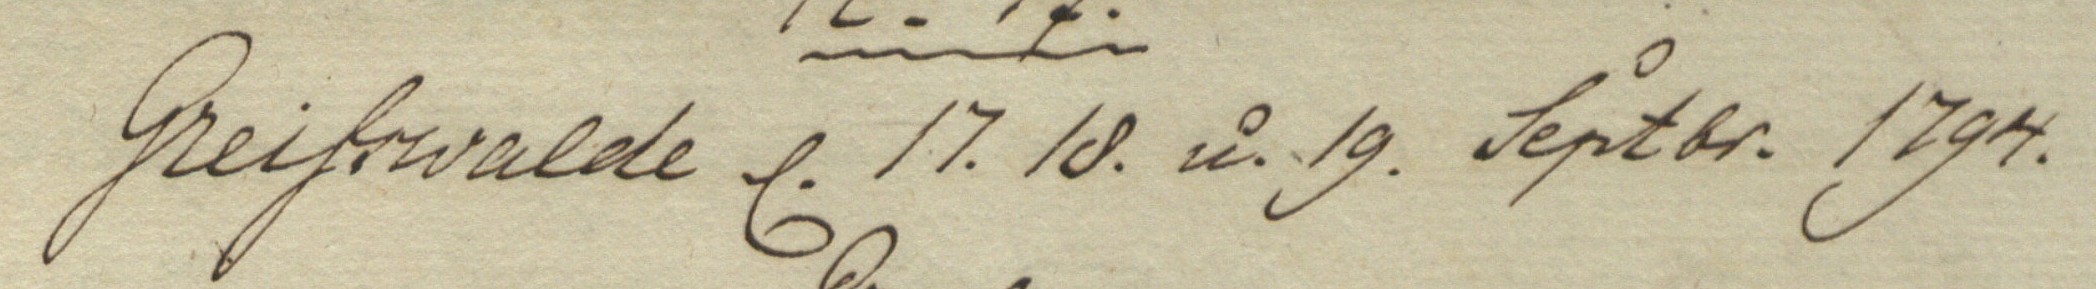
Greifswalde d. 17. 18. u. 19. Septbr. 179.
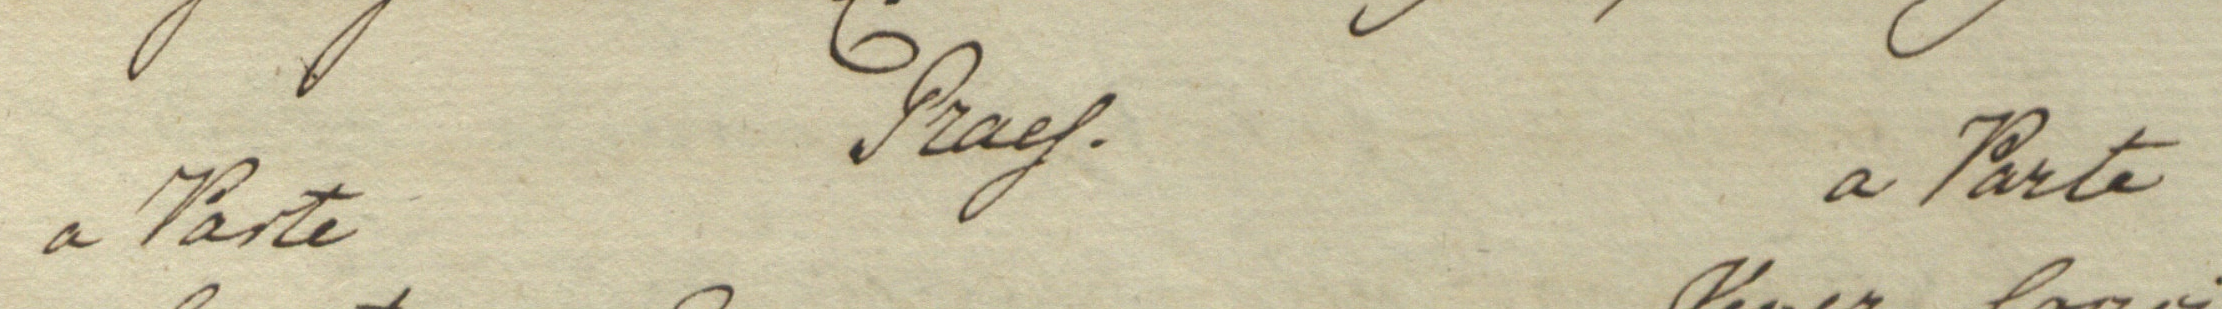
a Parte Parte
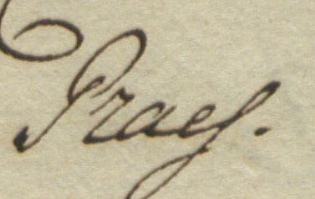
Prof.
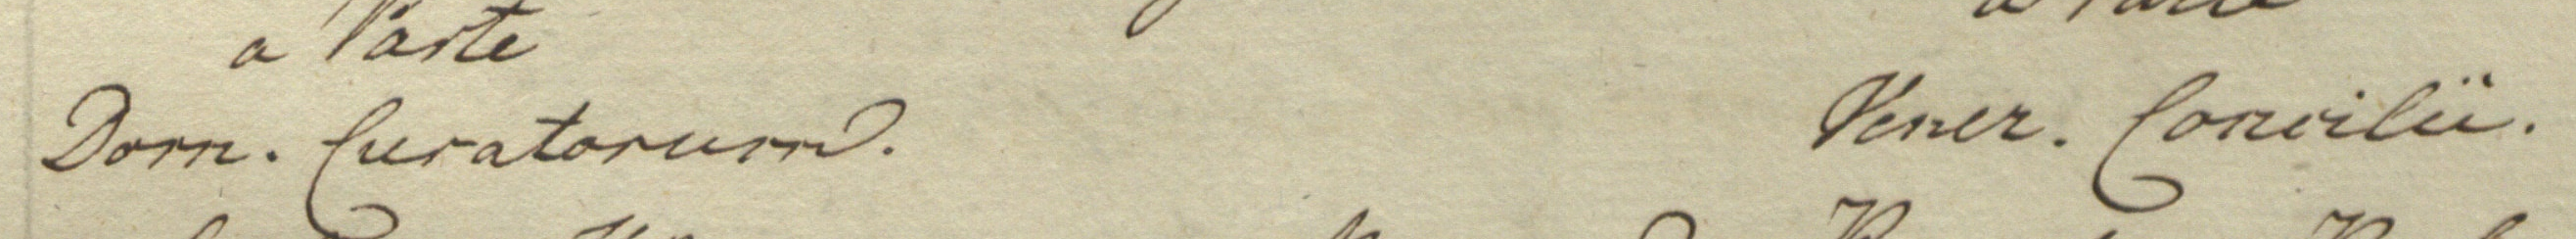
Dom. Curatorum. Vener. Concilii
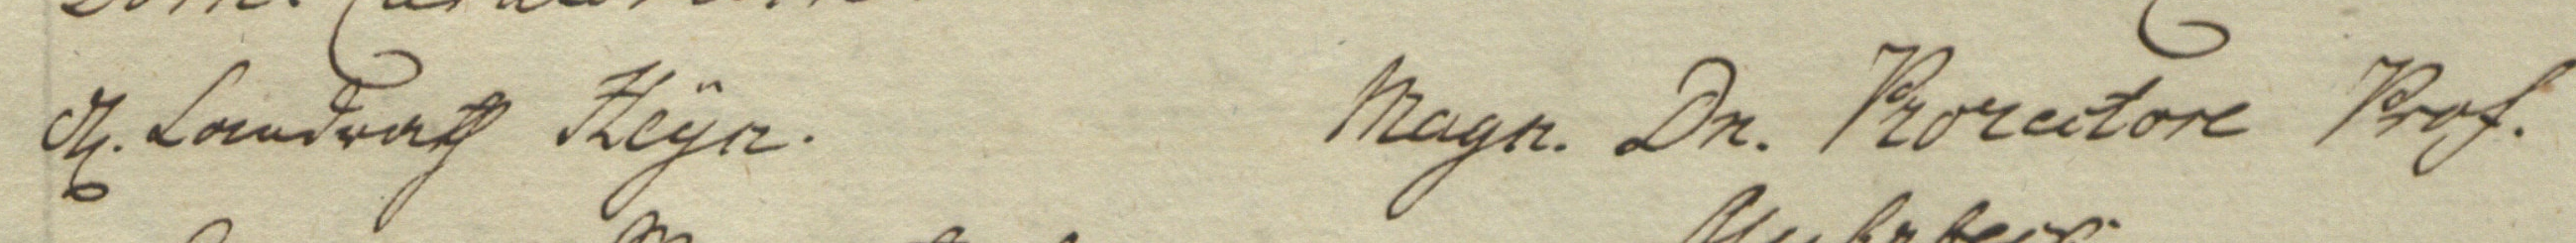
dh Landrath Heyn. Magn. Dn. Proectore Prof.
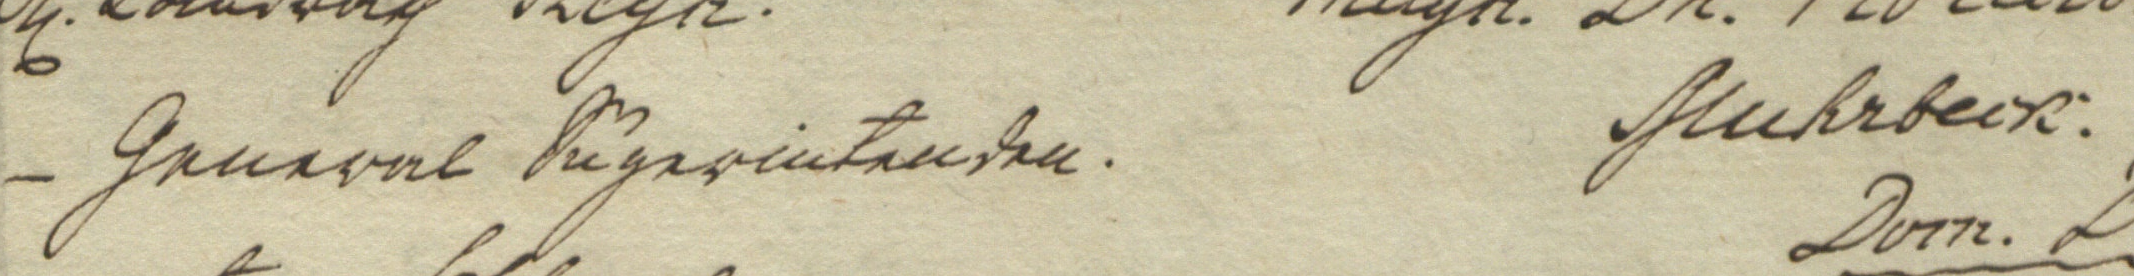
General Superintenden. Muhrbeck.
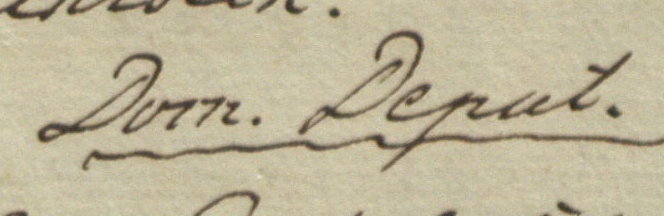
Dom. Deput.
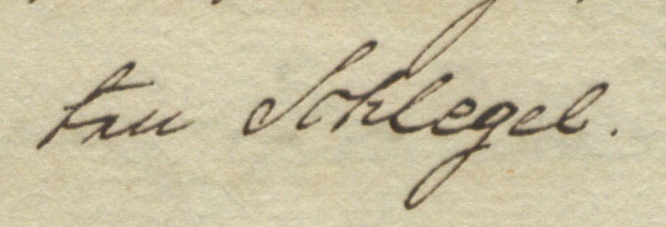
ten Schlegel.
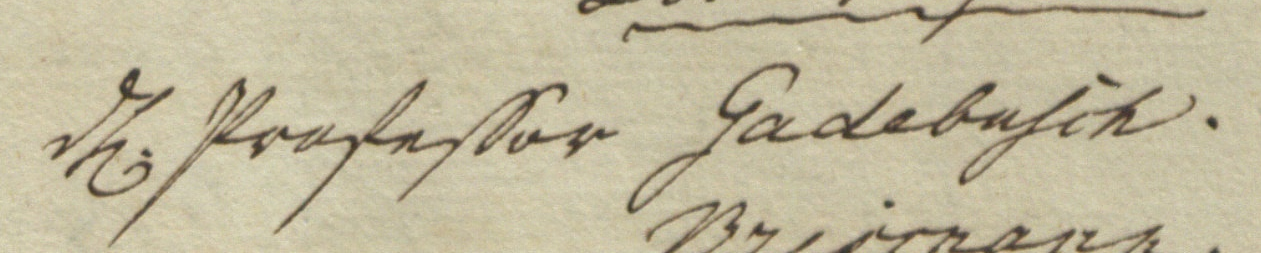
dh. Professor Gadebusch
